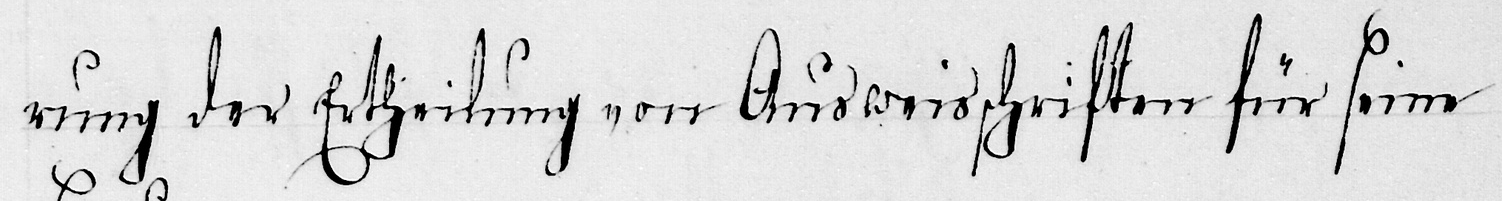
rung der Ertheilung von Ausweisschriften für seine
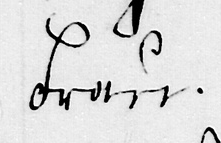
Frau.
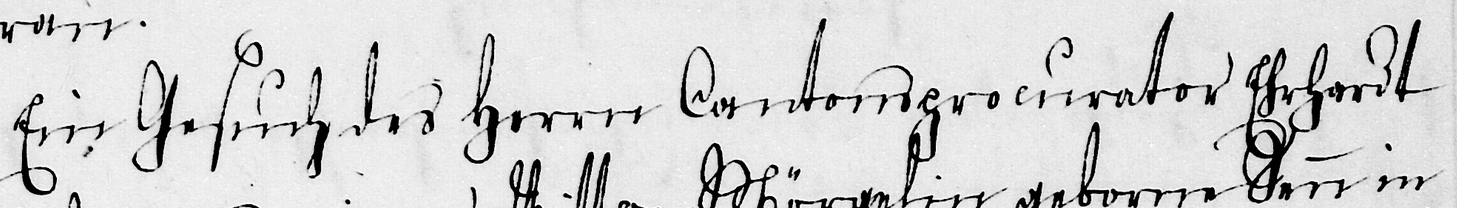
Ein Gesuch des Herrn Cantonsprocurator Ehrhardt
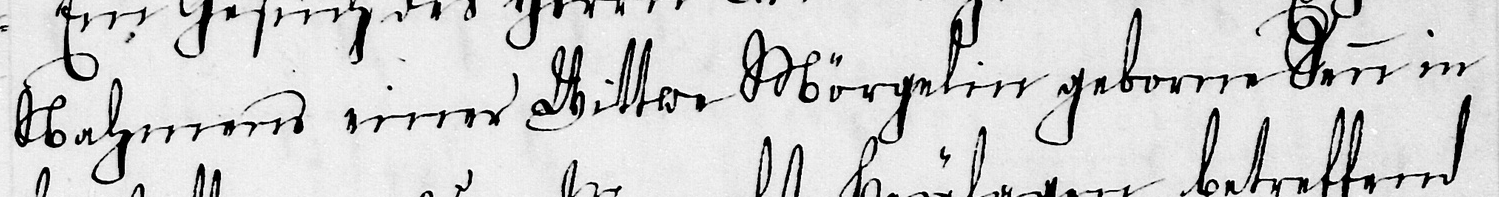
Nahmens einer Wittwe Mörgelin geborne Senn in
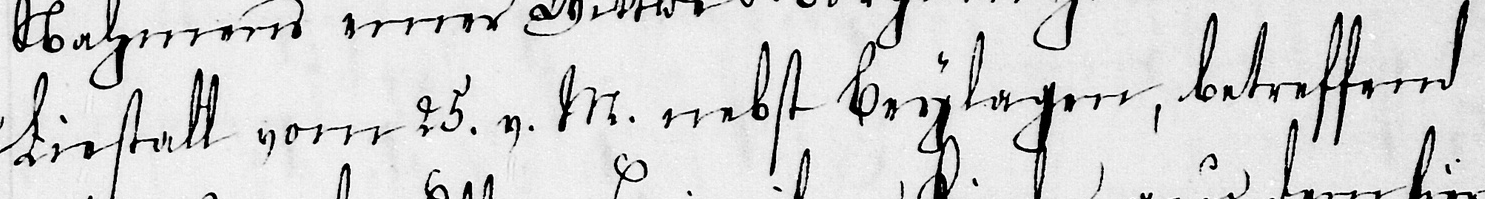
Liestall vom 25. v. M. nebst Beylagen, betreffend
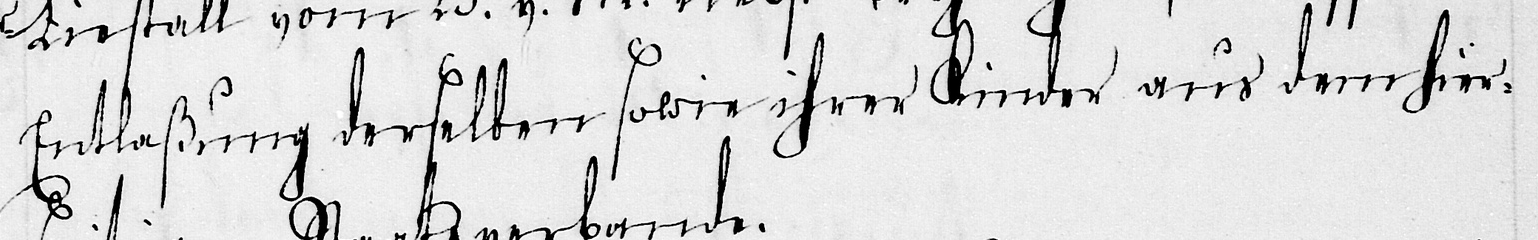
Entlaßung derselben sowie ihrer Kinder aus dem hier¬
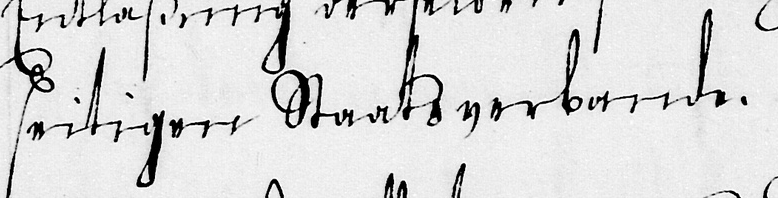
seitigen Staatsverbande.
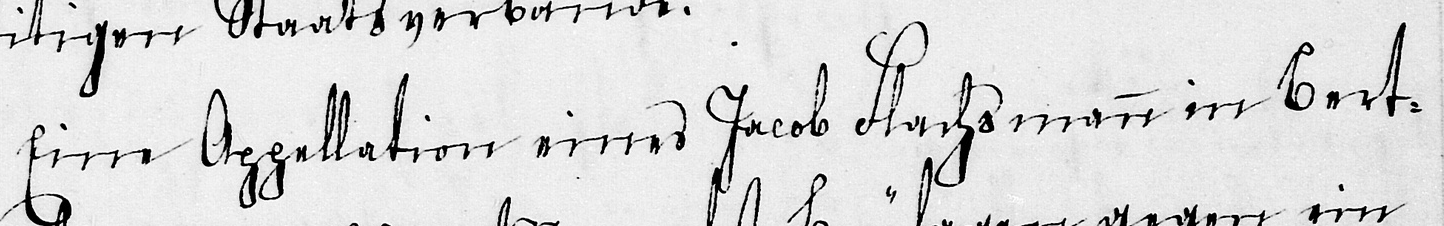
Eine Appellation eines Jacob Flachsmann in Bert¬
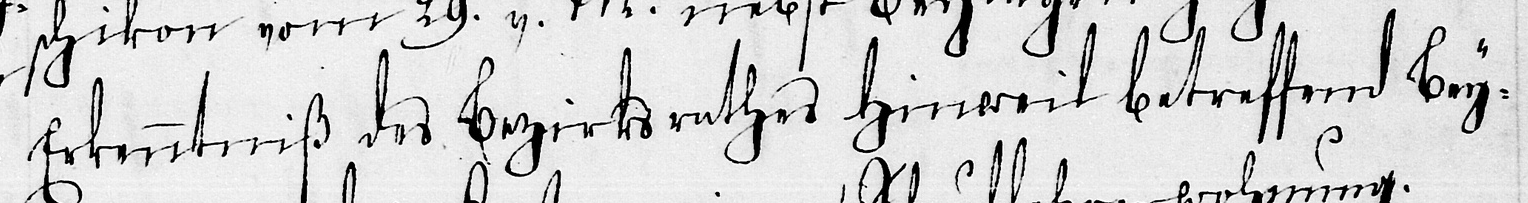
Erkenntniß des Bezirksrathes Hinweil betreffend Bey¬
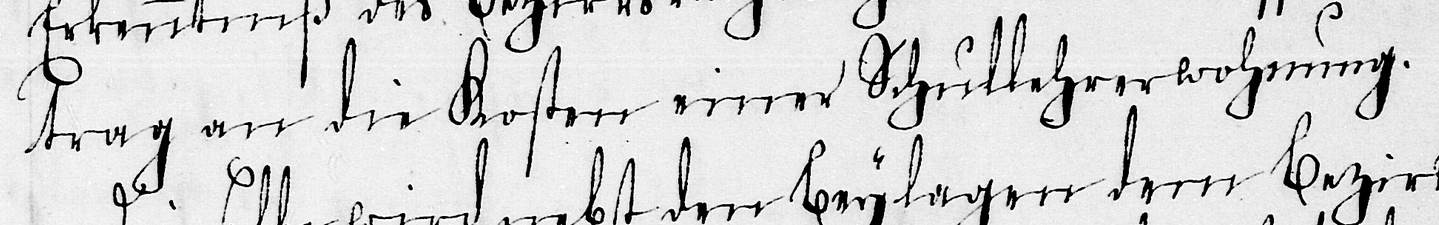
trag an die Kosten einer Schullehrerwohnung.
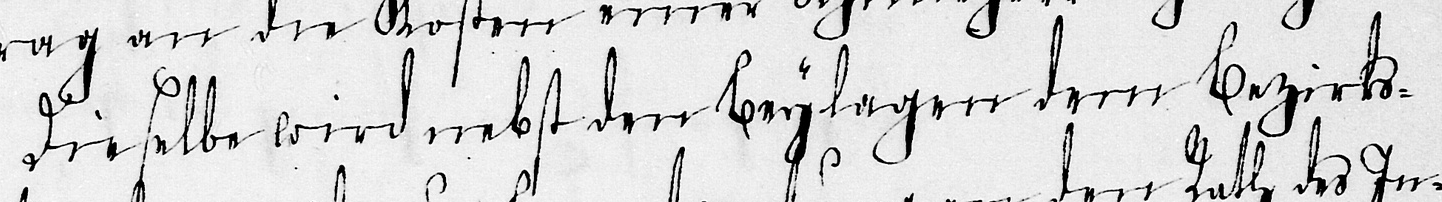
Dieselbe wird nebst den Beylagen dem Bezirks¬
